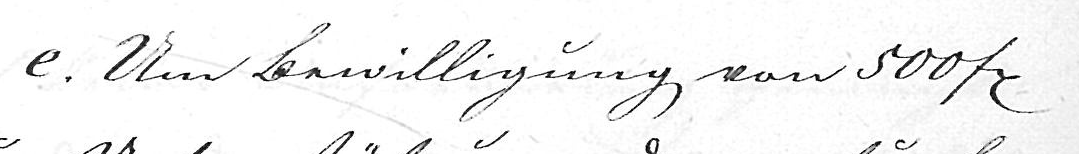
e. Um Bewilligung von 500 fr
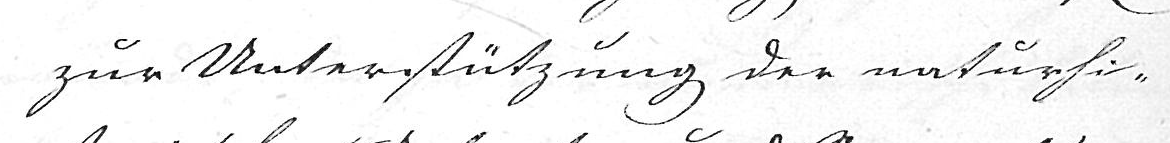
zur Unterstützung der naturhi-
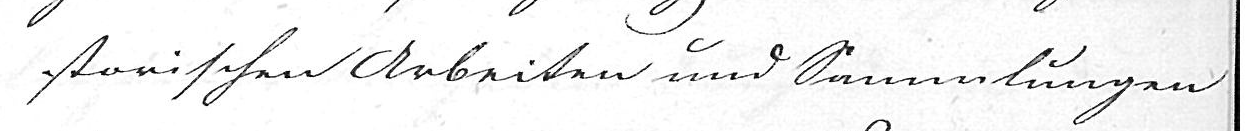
storischen Arbeiten und Sammlungen
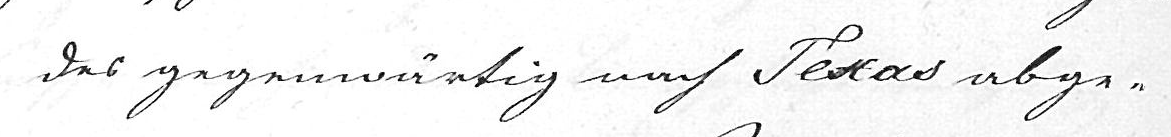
des gegenwärtig nach Texas abge-
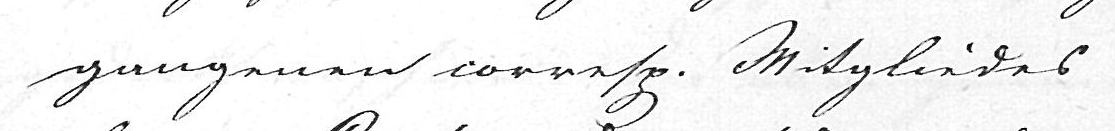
gangenen corresp. Mitgliedes
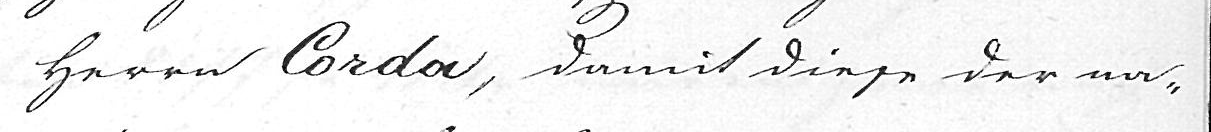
Herrn Corda, damit diese der na-
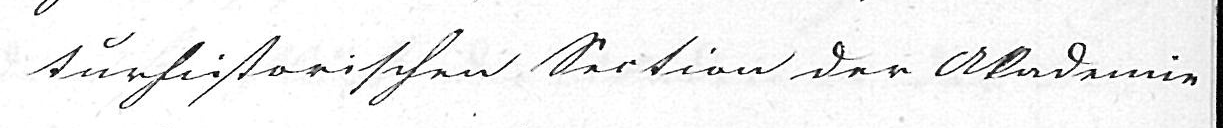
turhistorischen Section der Akademie
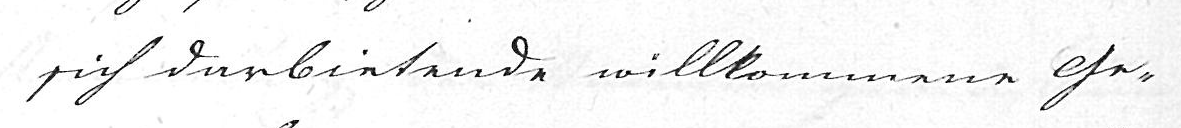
sich darbietende willkommene Ge-
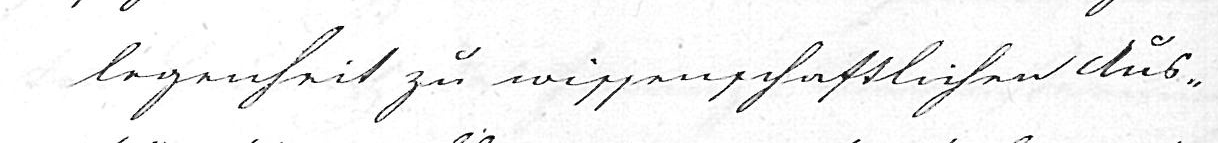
legenheit zu wissenschaftlichen Aus-
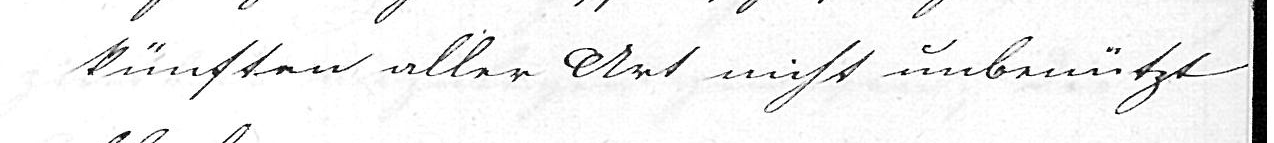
künften aller Art nicht unbenützt
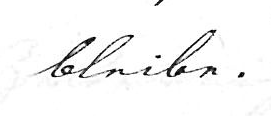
bleibe.
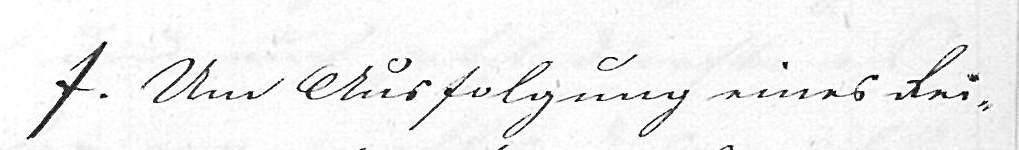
f. Um Ausfolgung eines Rei-
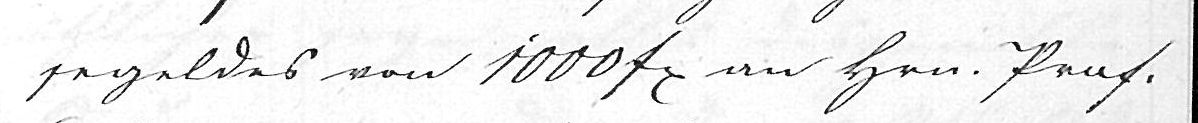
segeldes von 1000 fr an Hrn. Prof.
